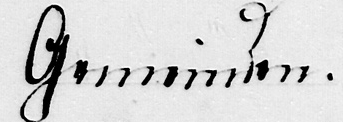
Gemeinden.
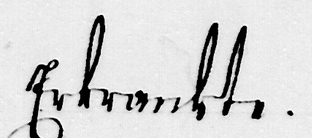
Erkrankte.
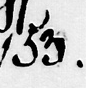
33.
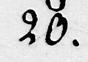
20.
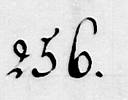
256.
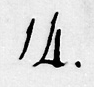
14.
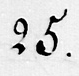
25.
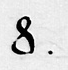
8.
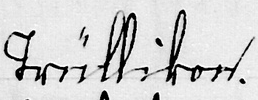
Trüllikon
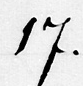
17.
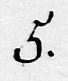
5.
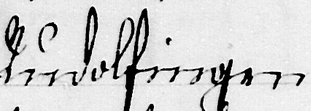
Rudolfingen
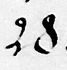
28.
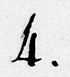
4.
